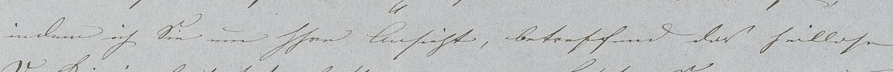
indem ich Sie um Ihre Ansicht, betreffend das heillose
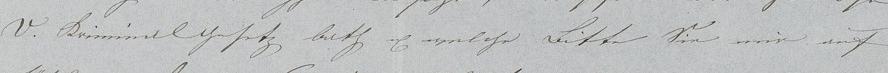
V. Kriminalgesetz bath & welche Bitte Sie mir auf
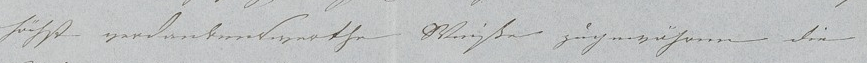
höchst verdankenswerthe Weiße zugewähren die
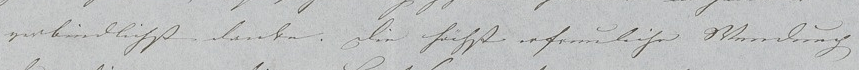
verbindlichst danke. Die höchst erfreuliche Wendung
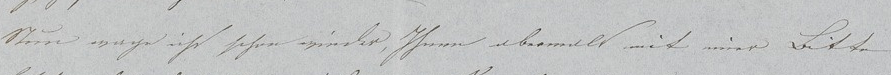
Nun wage ichs schon wieder, Ihnen abermals mit einer Bitte
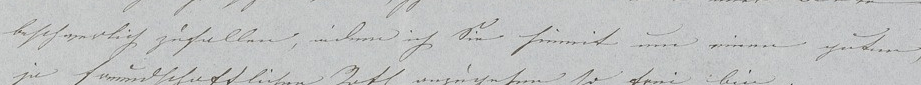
beschwerlich zufallen, indem ich Sie hiemit um einen guten;
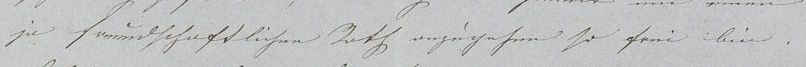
ja freundschaftlichen Rath anzugehen so frei bin.
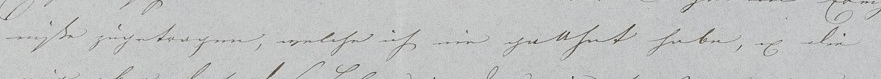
niße zugetragen, welche ich nie geahnt habe, & die
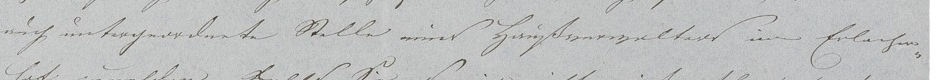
auch untergeordnete Stelle eines Haußverwalters im Erlacher-
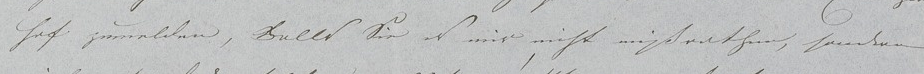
hof zumelden, Falls Sie es mir nicht mißrathen, sondern
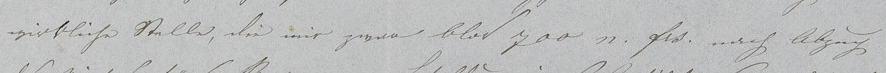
wirkliche Stelle, die mir zwar blos 700 n. frs. nach Abzug
